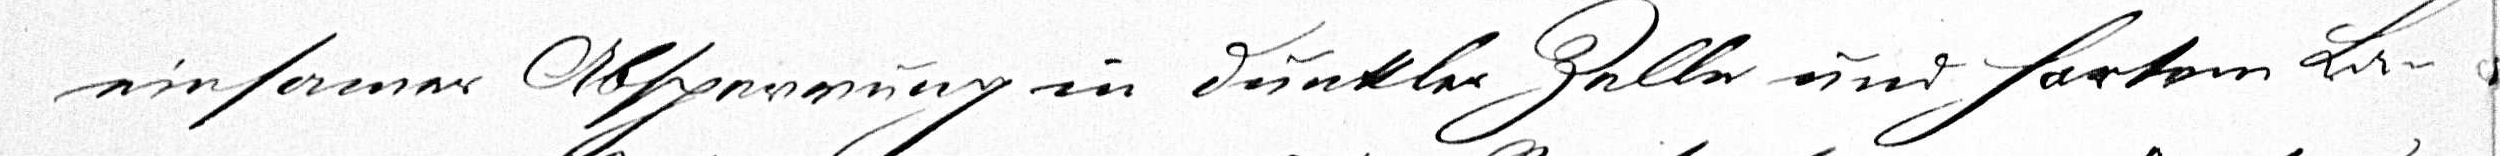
einsamer Absperrung in dunkler Zelle und hartem La¬
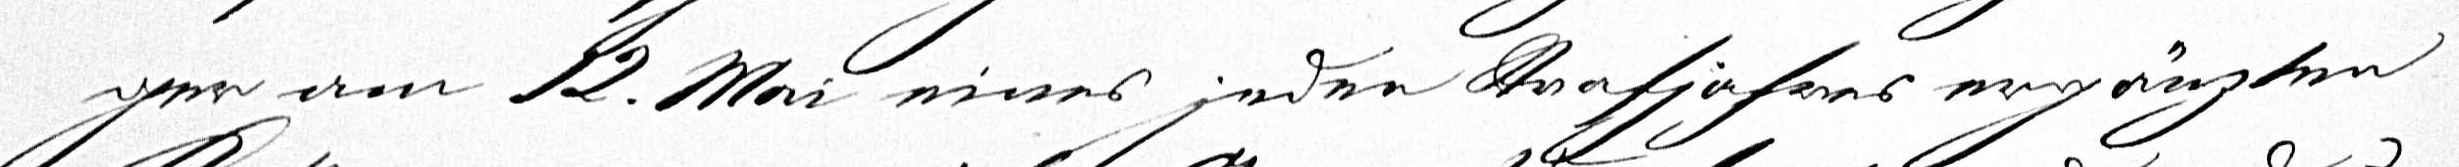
ger am 12. Mai eines jeden Strafjahres ergänzten
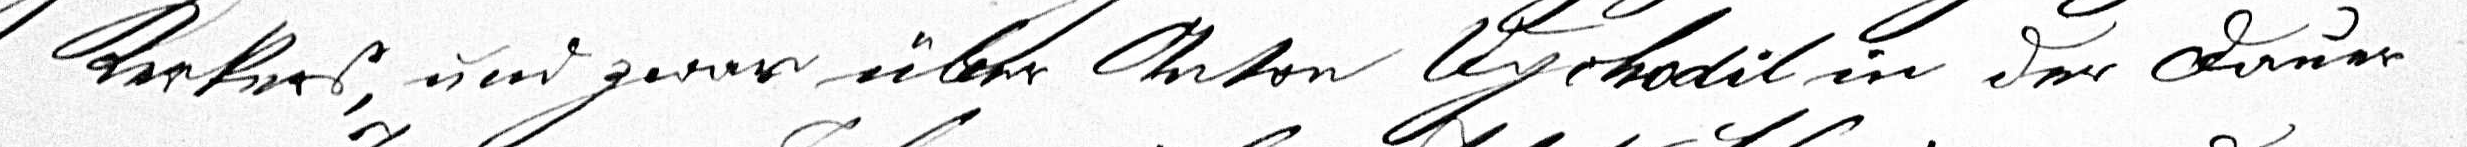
Kerkers, und zwar über Anton Vychodilj in der Dauer
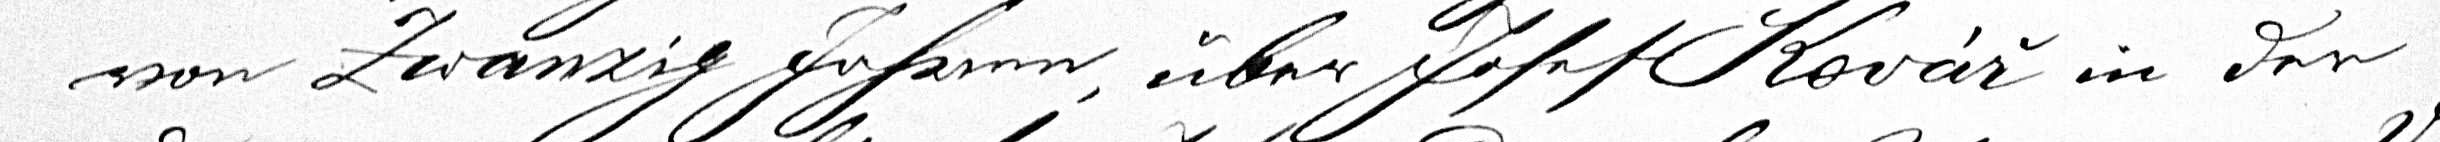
von Zwanzig Johann, über Josef Kovár in den
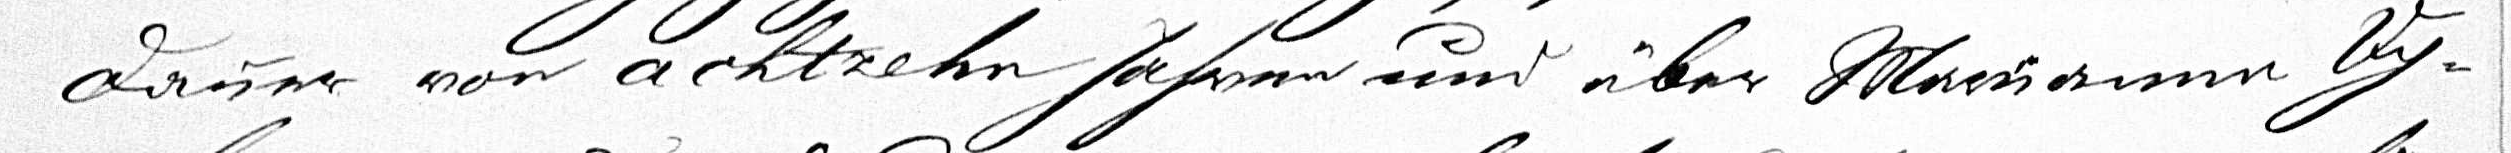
Dauer von achtzehn Jahren und über Marianna Vy¬
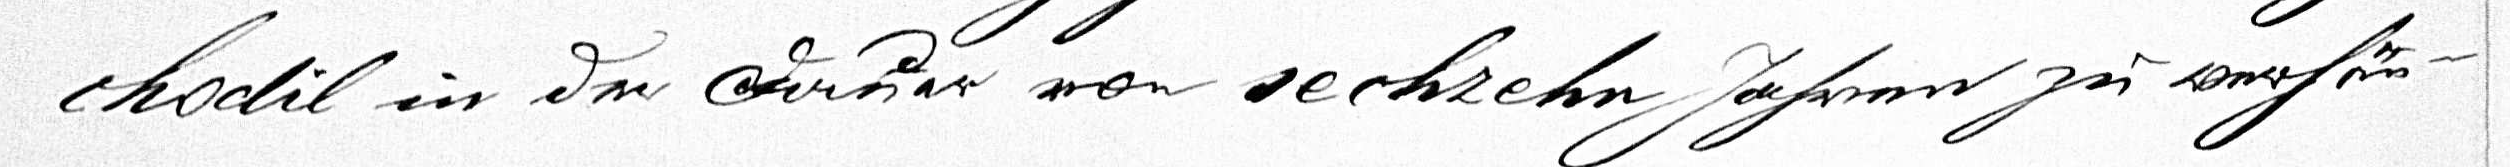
chodil in der Dauer von sechzehn Jahren zu verhän¬
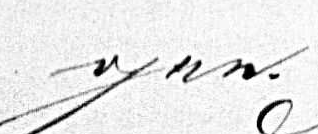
gen.
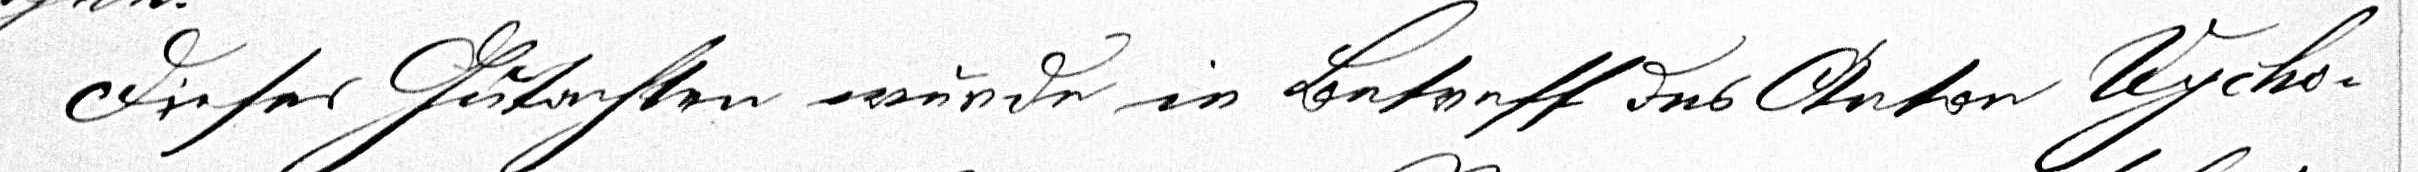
Dieses Gutachten wurde in Betreff des Anton Vycho¬
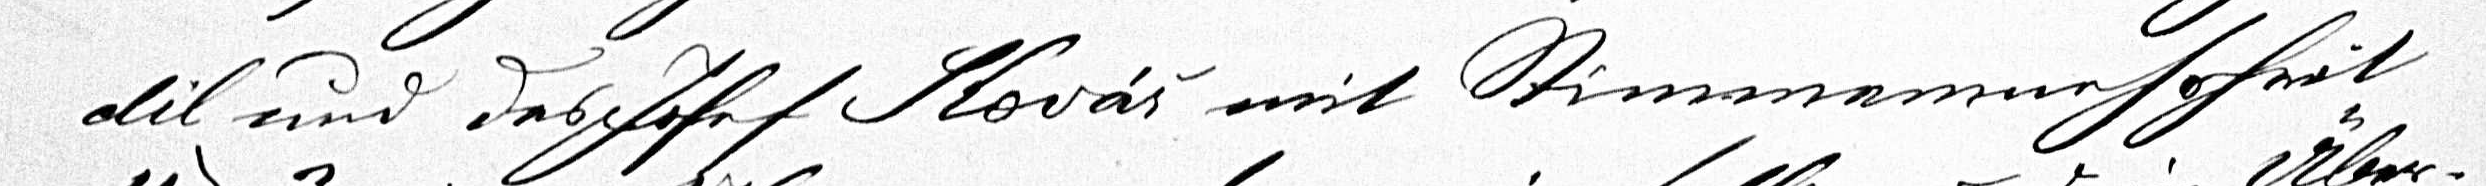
dil und des Josef Kovár mit Stimmenmehrheit
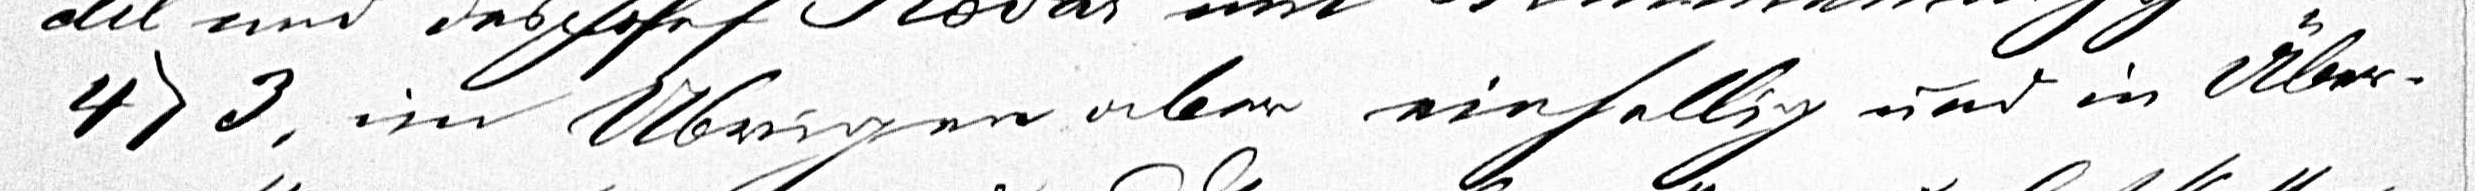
4>3, im Ubrigen aber einhellig und in Über¬
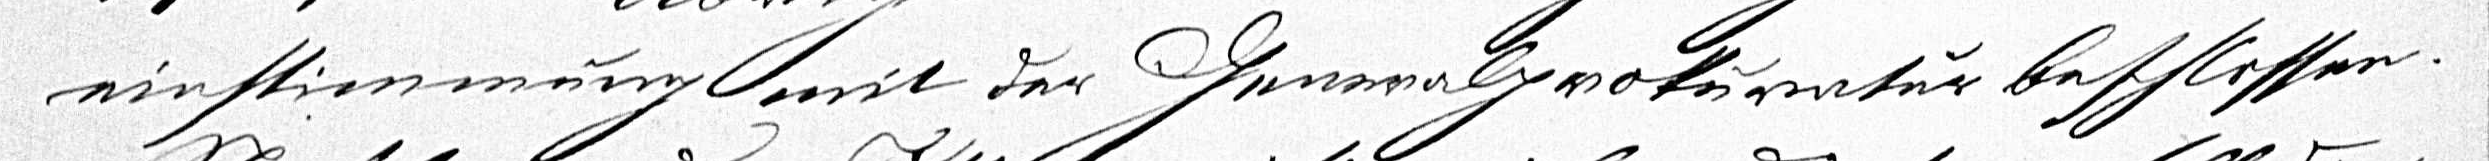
einstimmung mit der Generalprokuratur beschlossen.
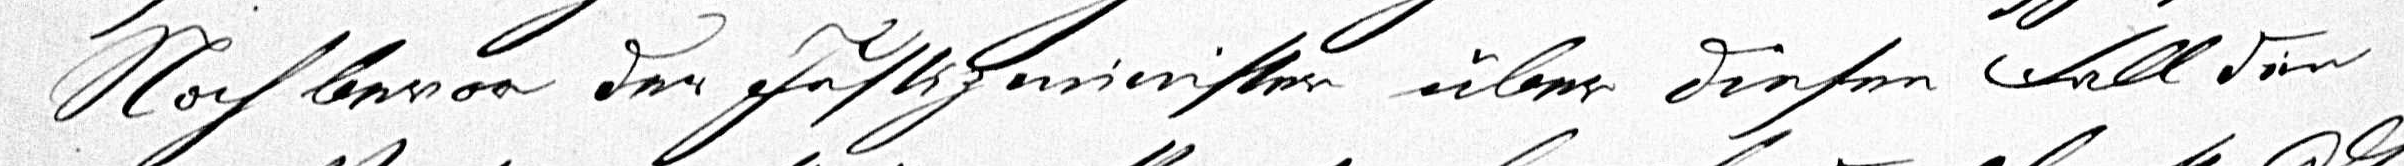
Noch bevor der Justizminister über diesen Fall den
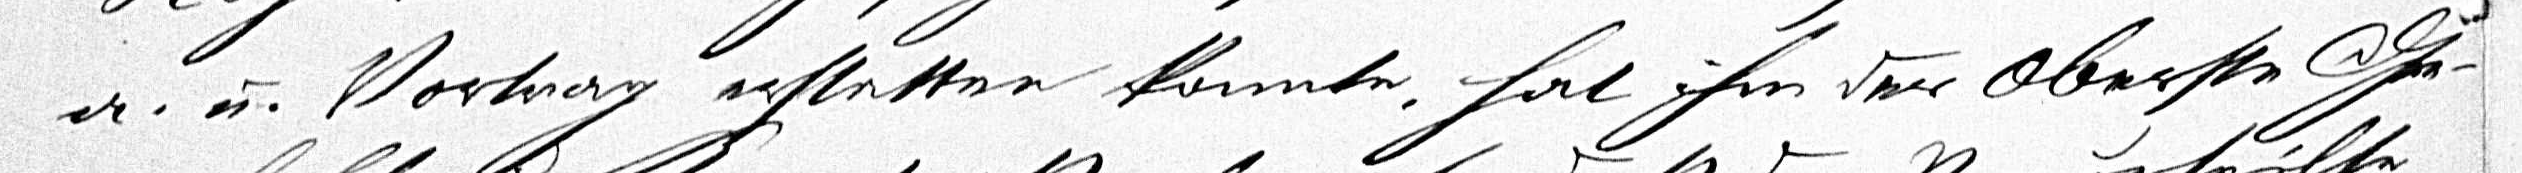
a. u. Vortrag erstatten konnte, hat ihm der Oberste Ge¬
